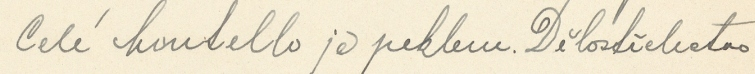Celé Montello je peklem. Dělostřelectvo
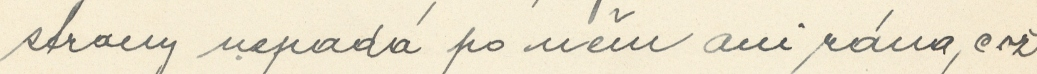strany nepadá po něm ani rána, což
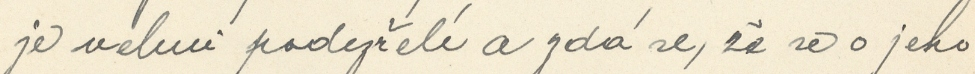je velmi podezřelé a zdá se, že se o jeho
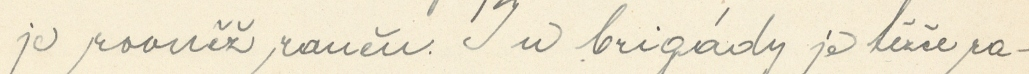je rovněž raněn. I u brigády je těžce ra-
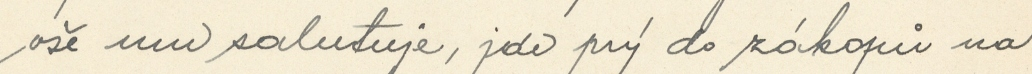vše mu salutuje, jde prý do zákopů na
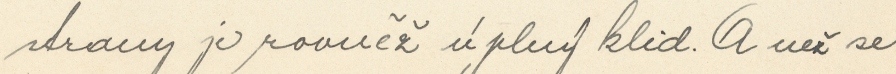strany je rovněž úplný klid. A než se
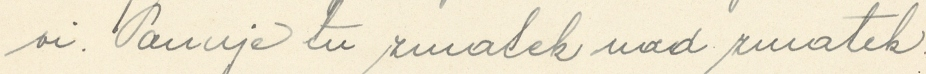vi. Panuje tu zmatek nad zmatek.
